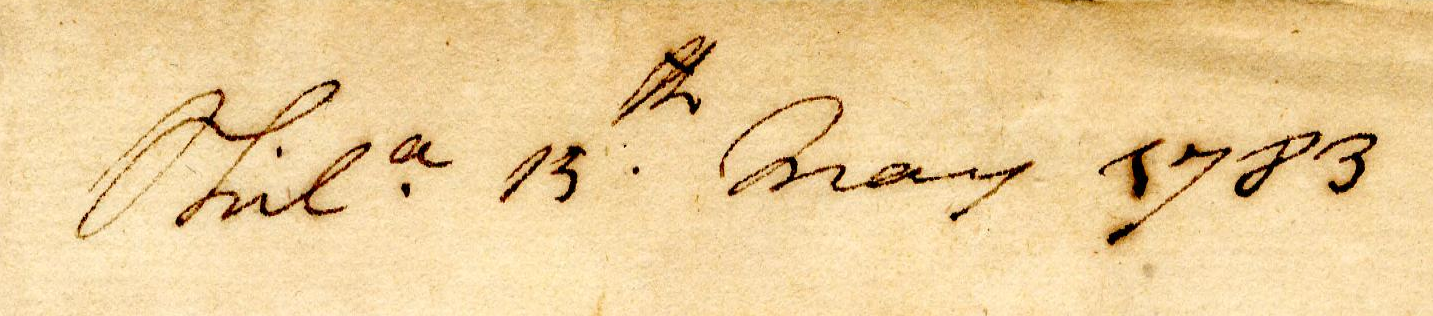Phil^a 15^th. May 1783
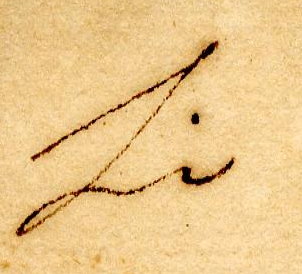Sir
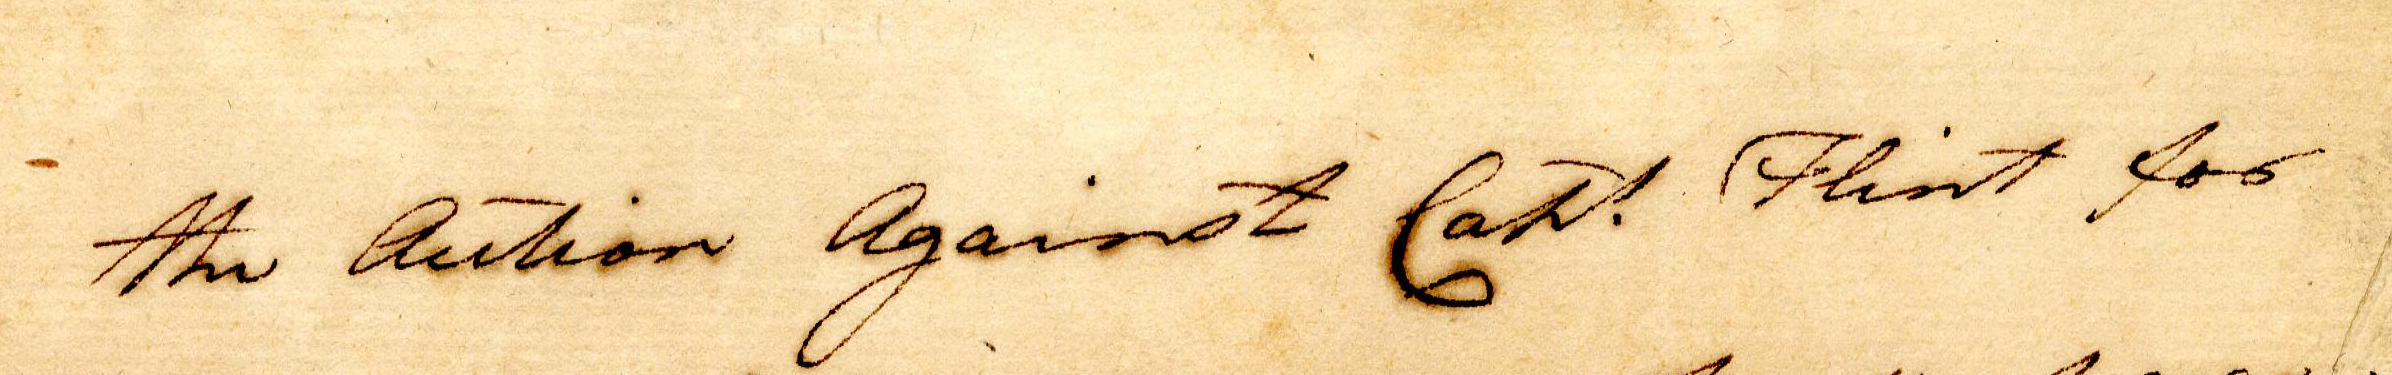the Action Against Cap^t. Flint for
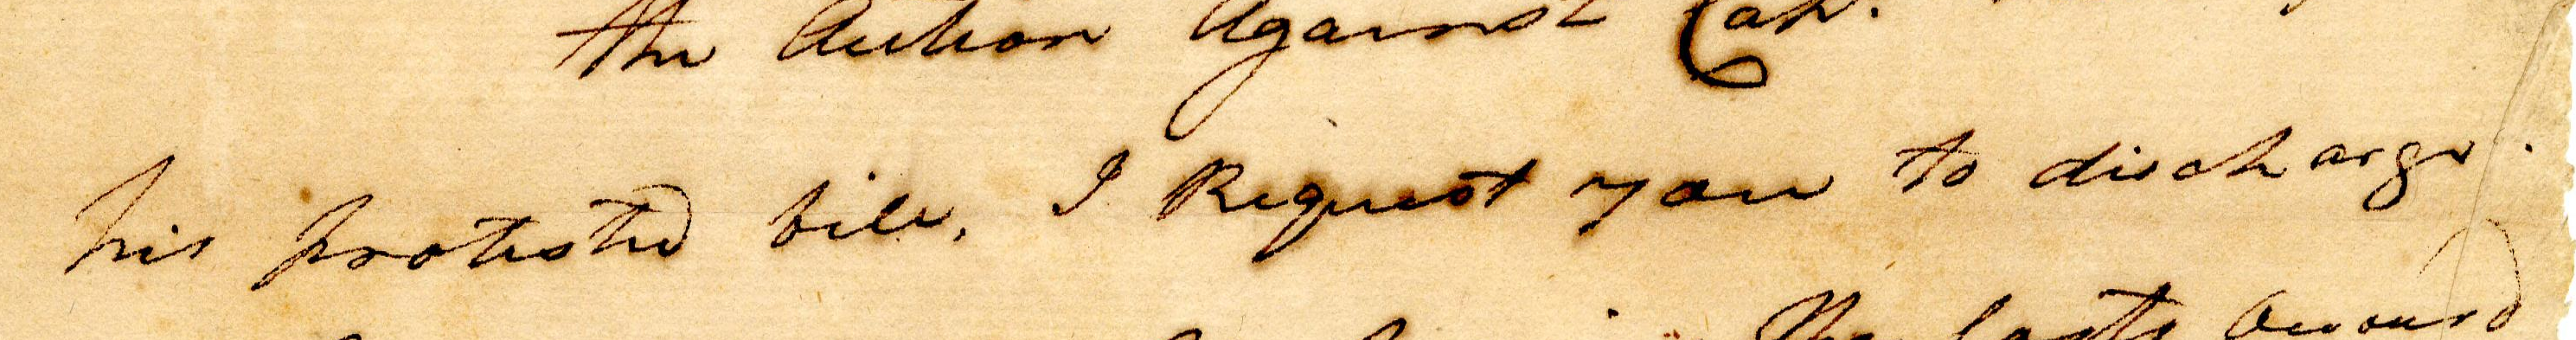his protested bill, I Request you to discharge
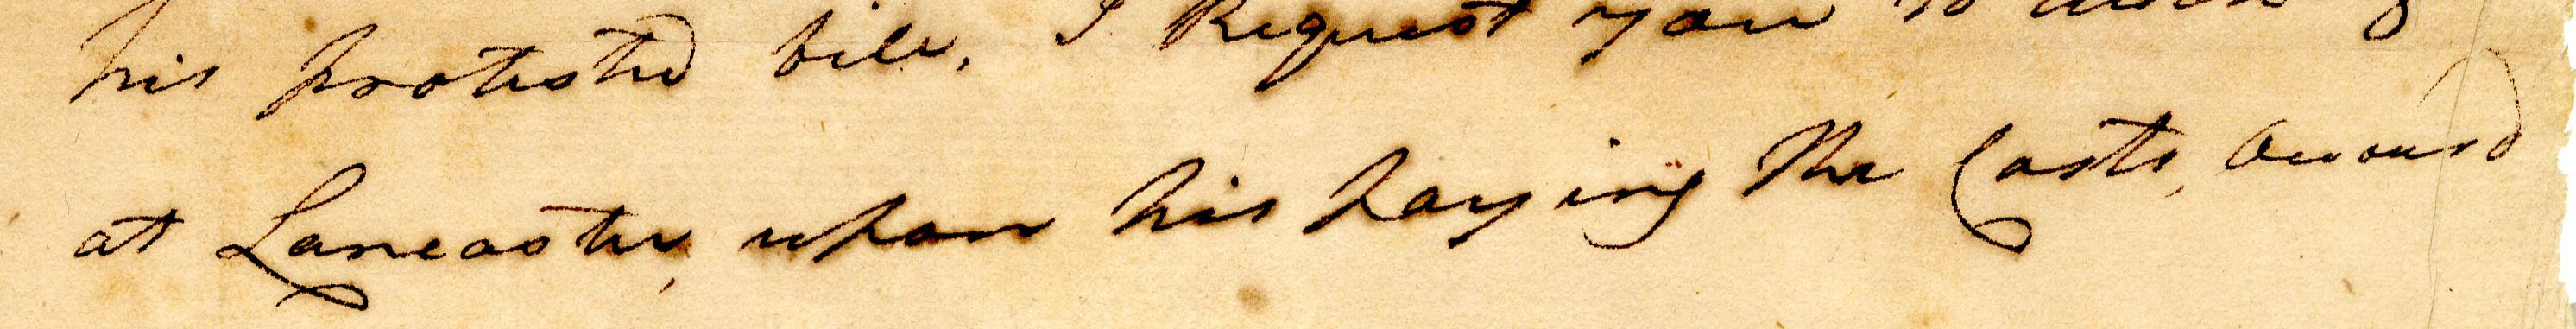at Lancaster when his laying the Casts, accord
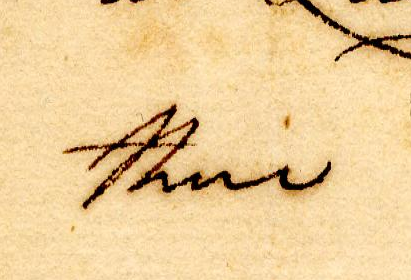there
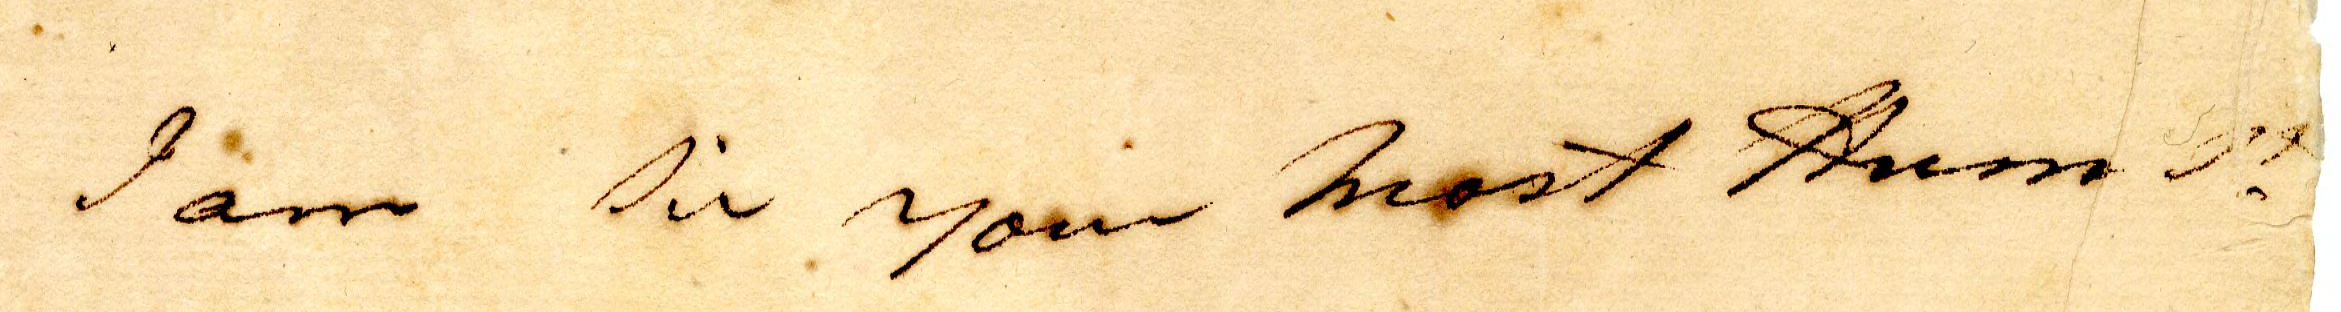I am sir your most Hum S^t:
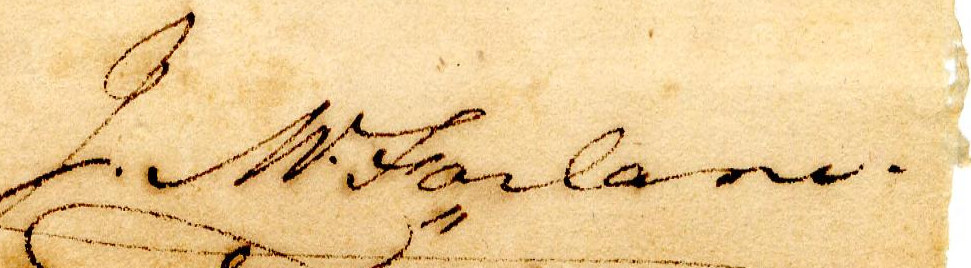J. M^c. Farlane.
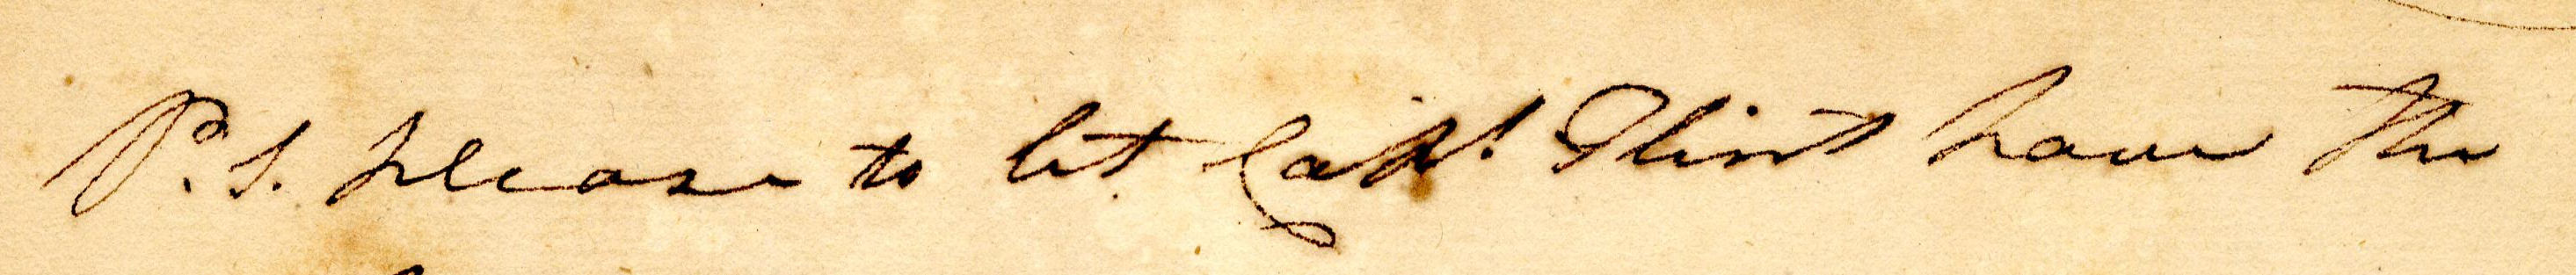P. S. please to let Capt. Flint have the
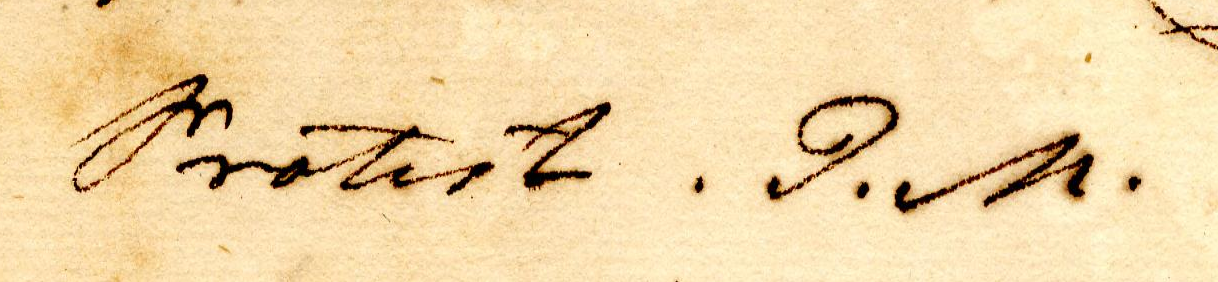Protest. J. M.
